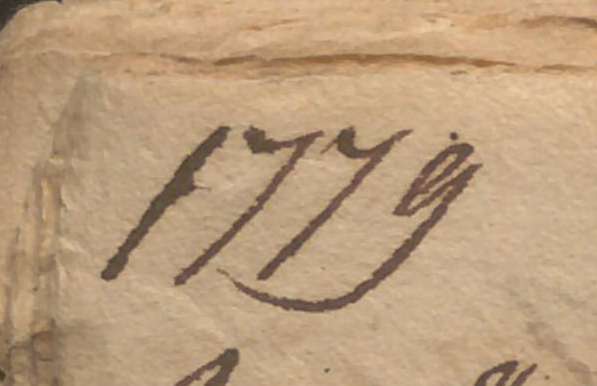1779
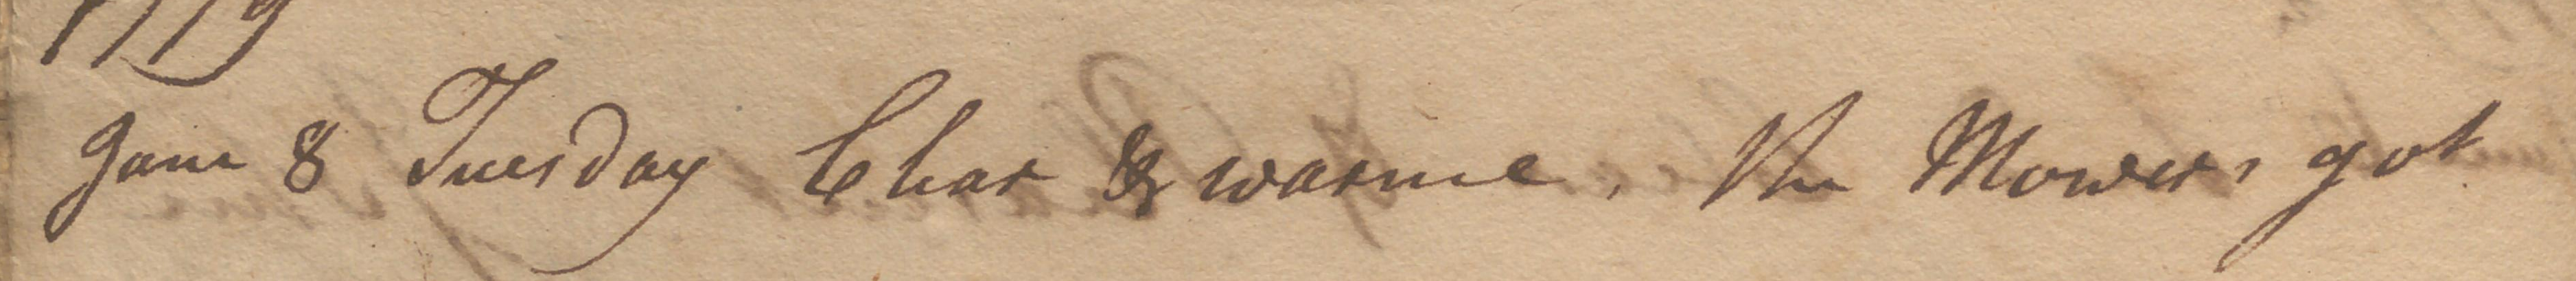June 8 Tuesday Clear & warme. the Mowers got
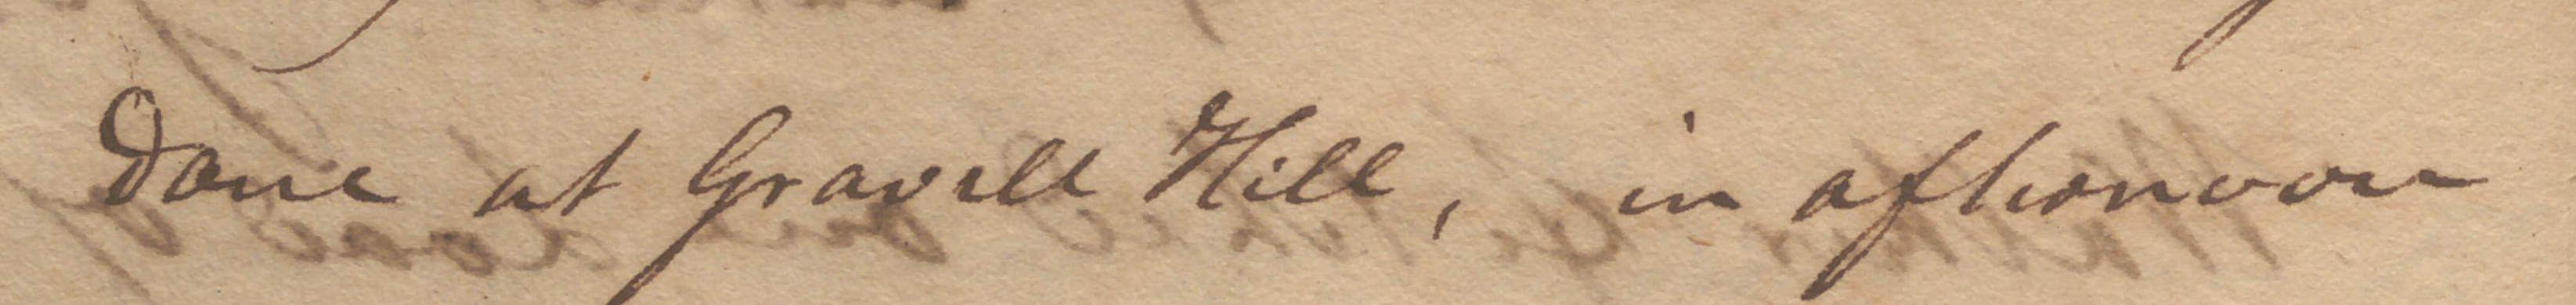done at Gravell Hill, in afternoon
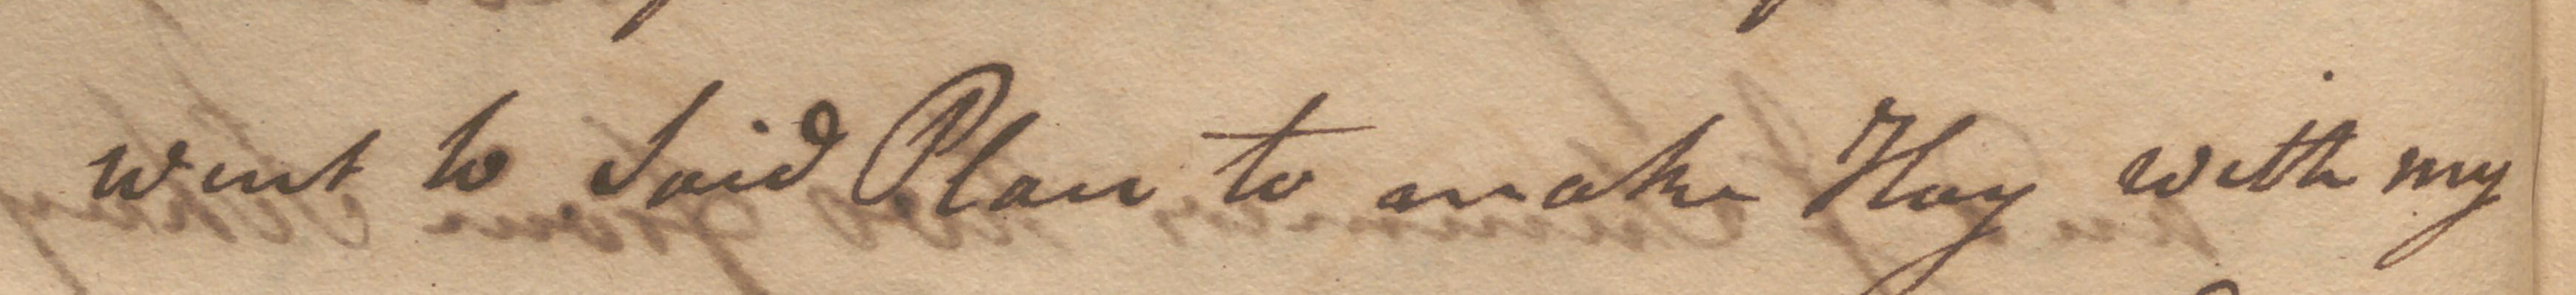went to said Place to make Hay with my
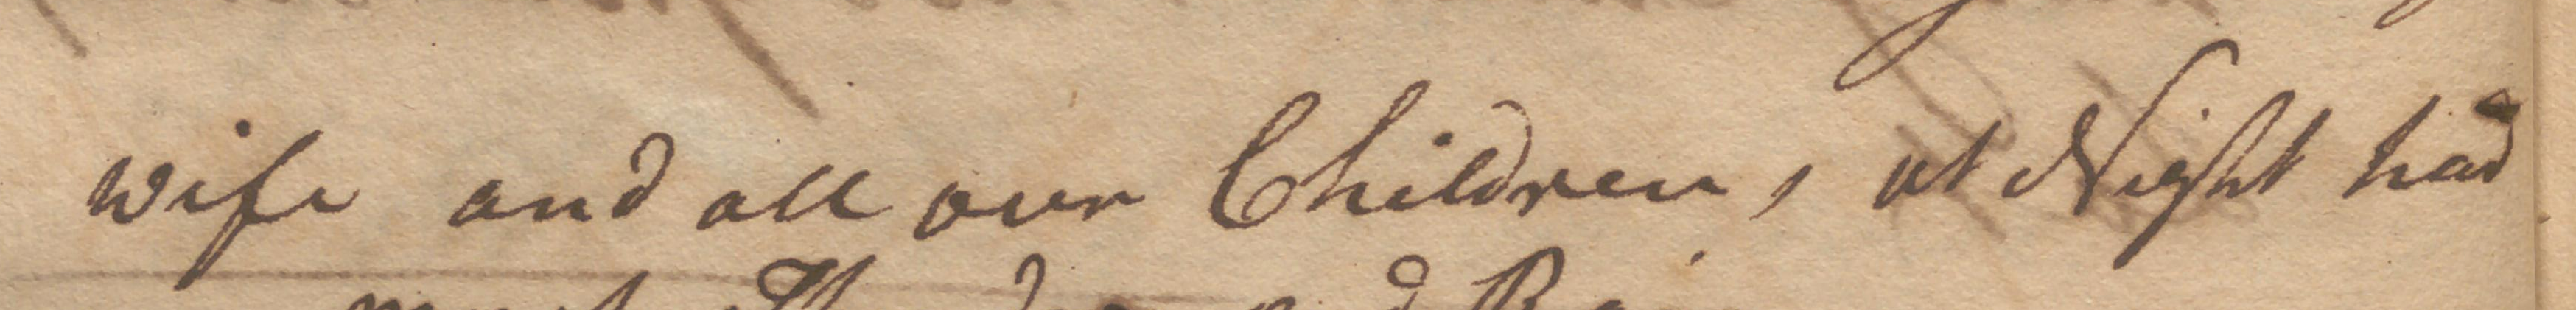wife and all our Children, at Night had
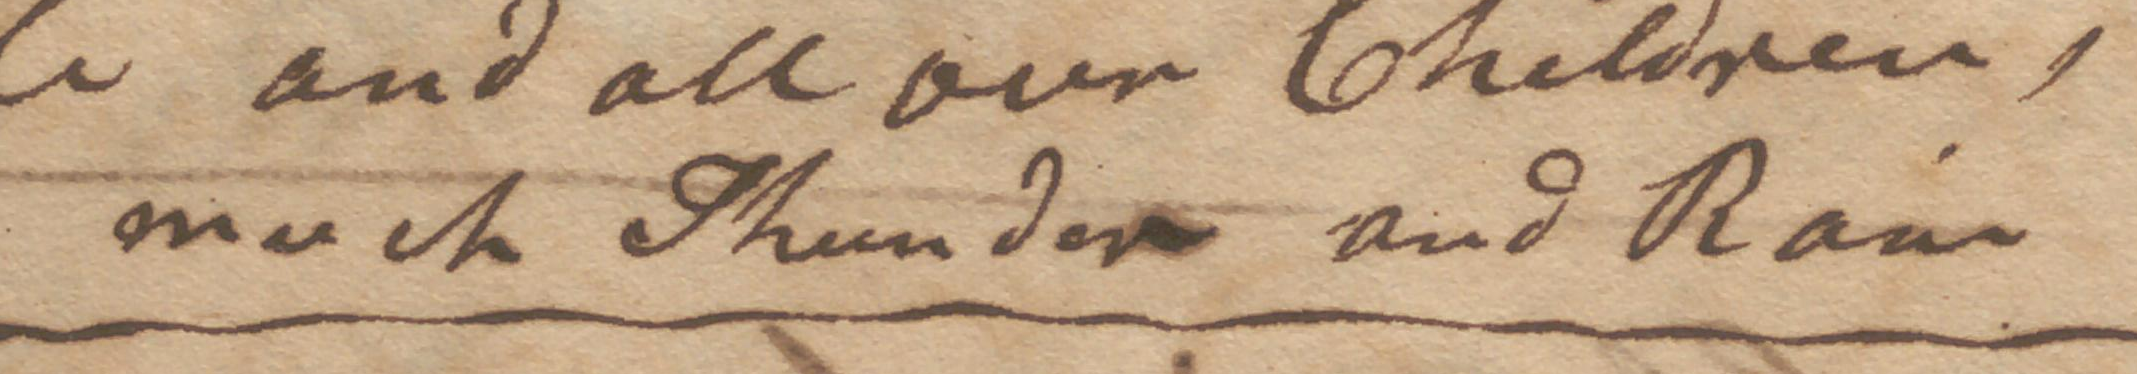much Thunder and Rain
